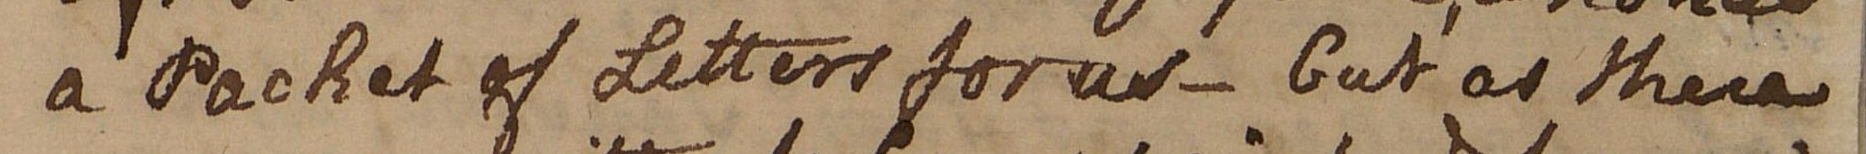a Packet of Letters for us- but as there
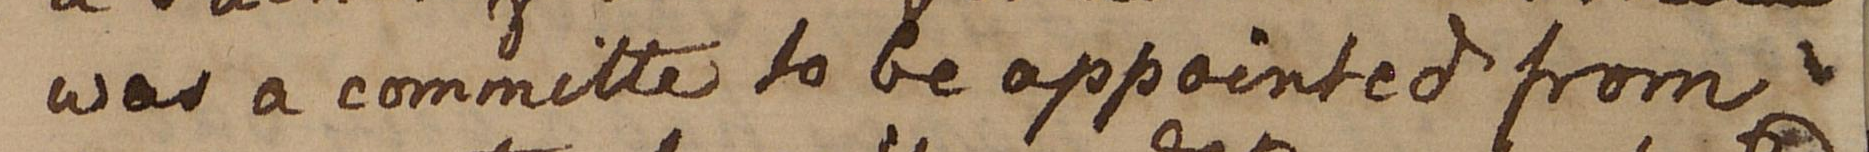was a committe to be appointed from
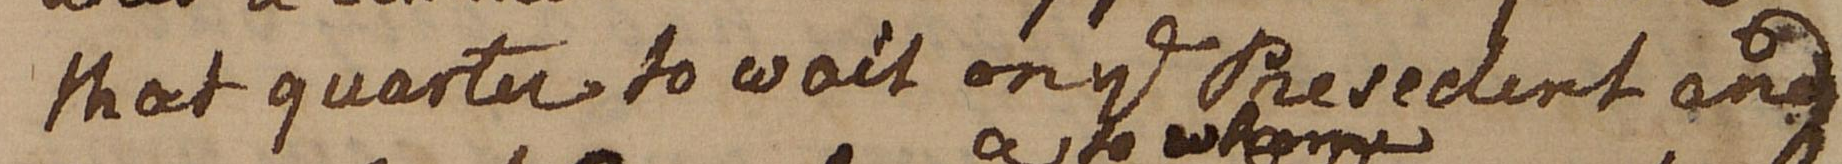that quarter to wait on y^e Presedent and
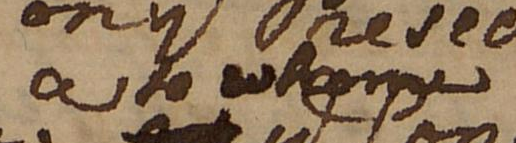to whom
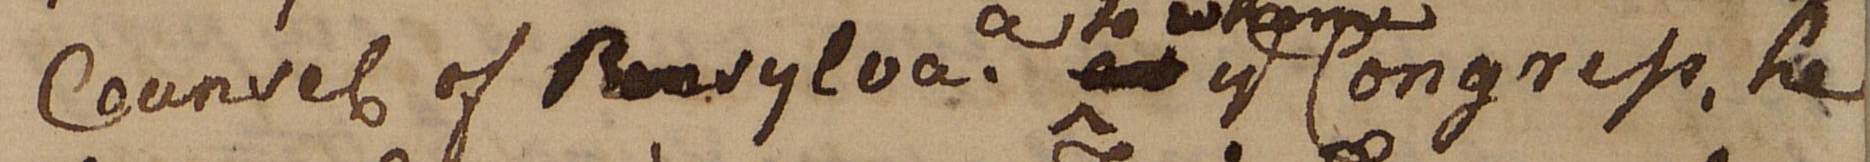Counsel of Pensylva^a. [__] y^e Congress, he
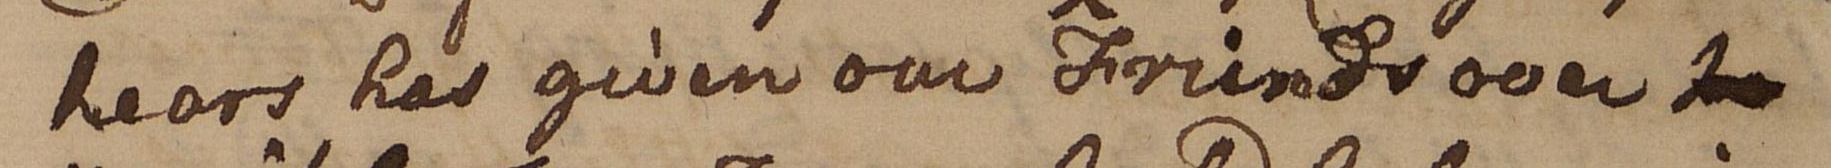hears has given our Friends over [__]
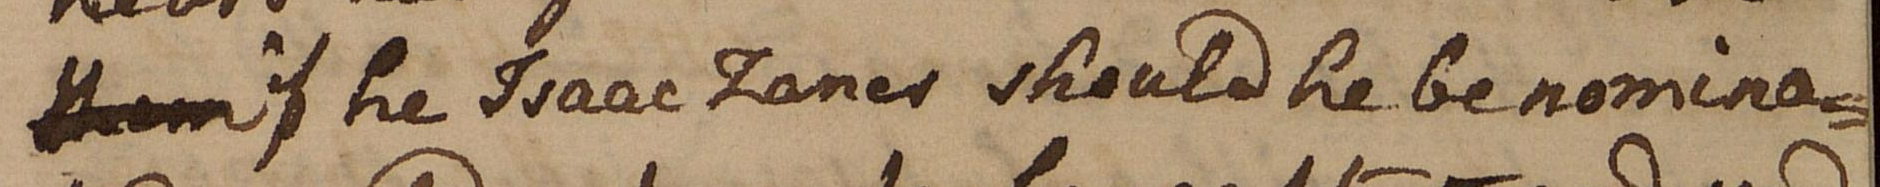[them] if he Issac Zanes should he be nomina-
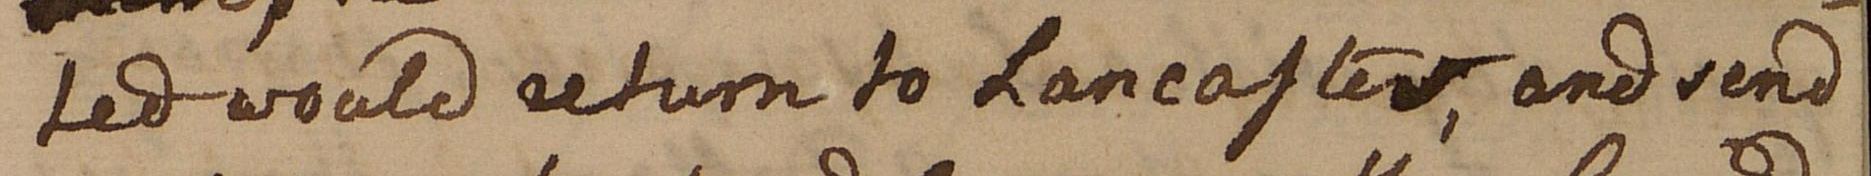ted would return to Lancaster, and send
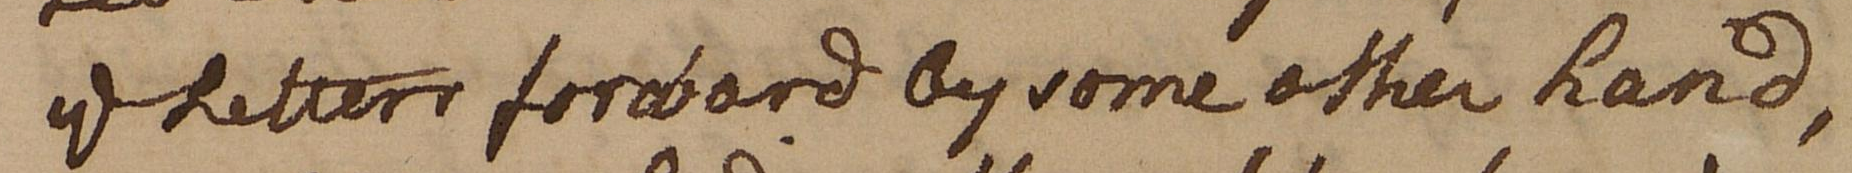y^e Letters forward by some other hand,
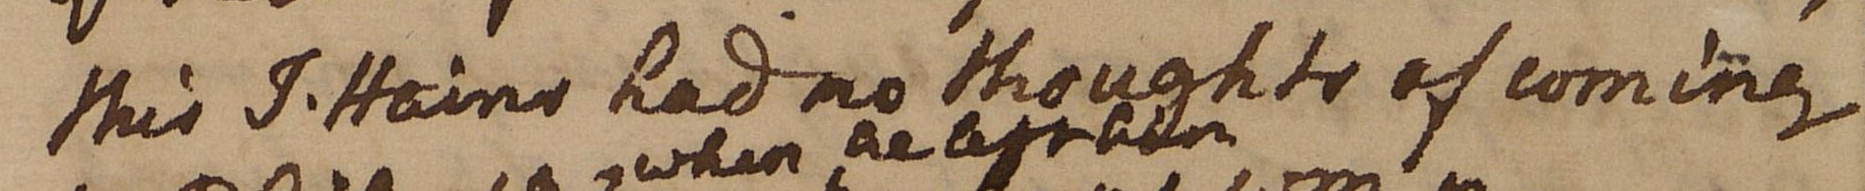this J. Hains had not thoughts of coming
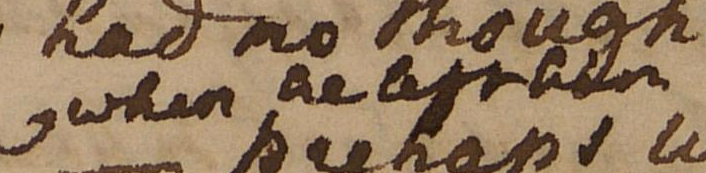when as again
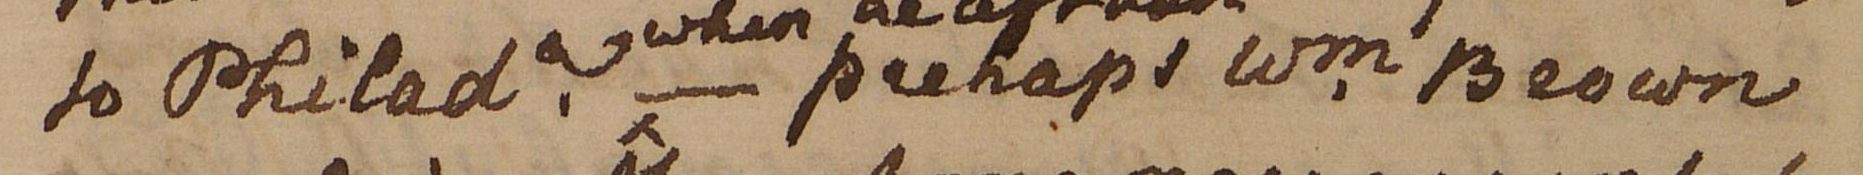to Philad.^a- ^ prehaps W^m. Brown
